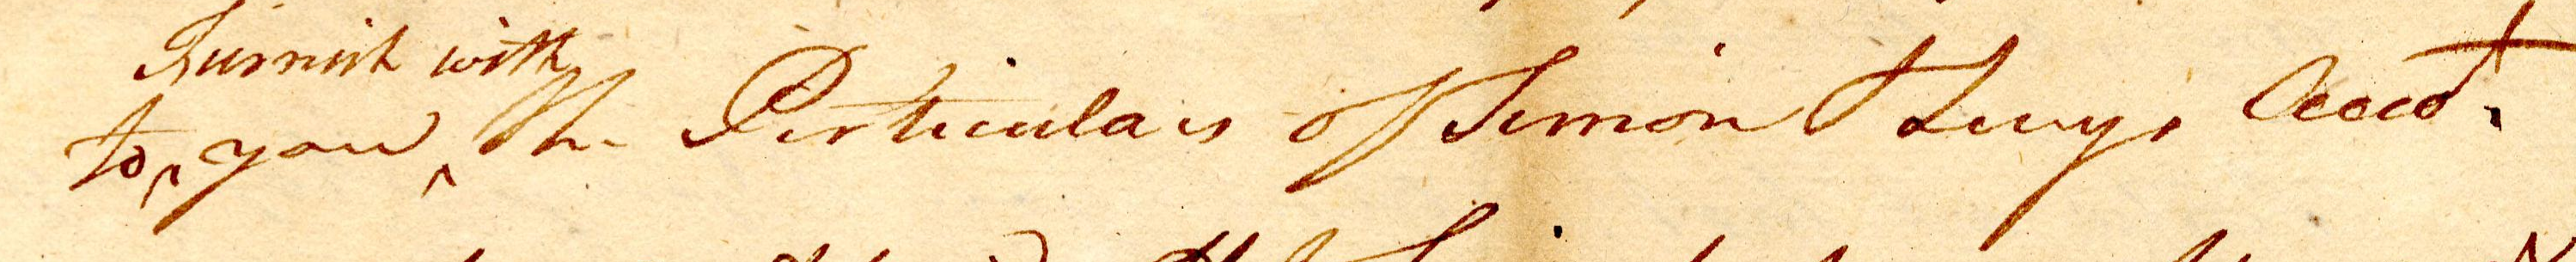to ^ you ^ the Perticulars of Simon & Lucy's Acco^t
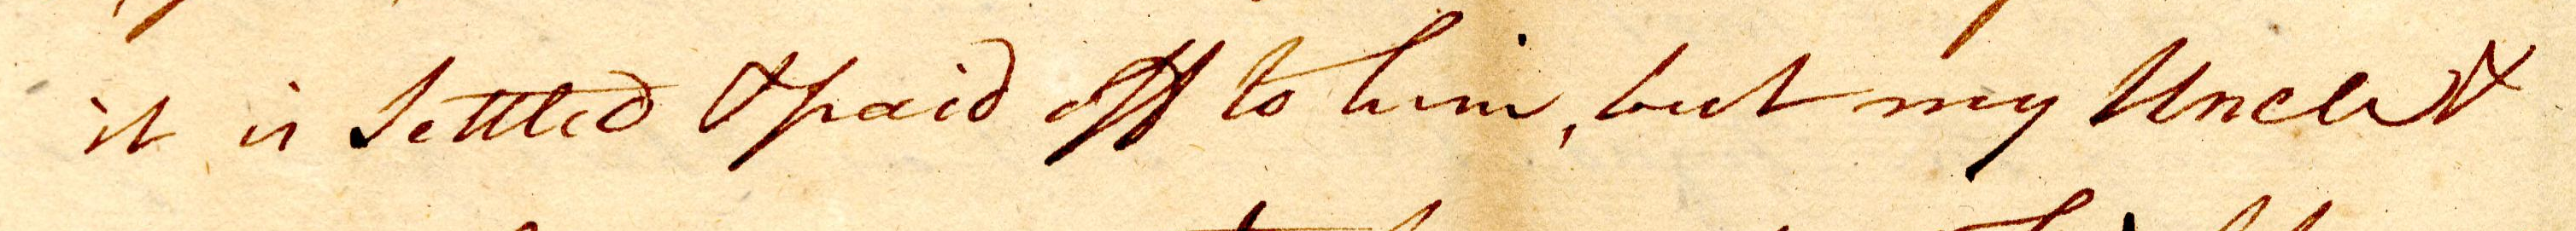it is Settled & paid off to him, but my Uncle
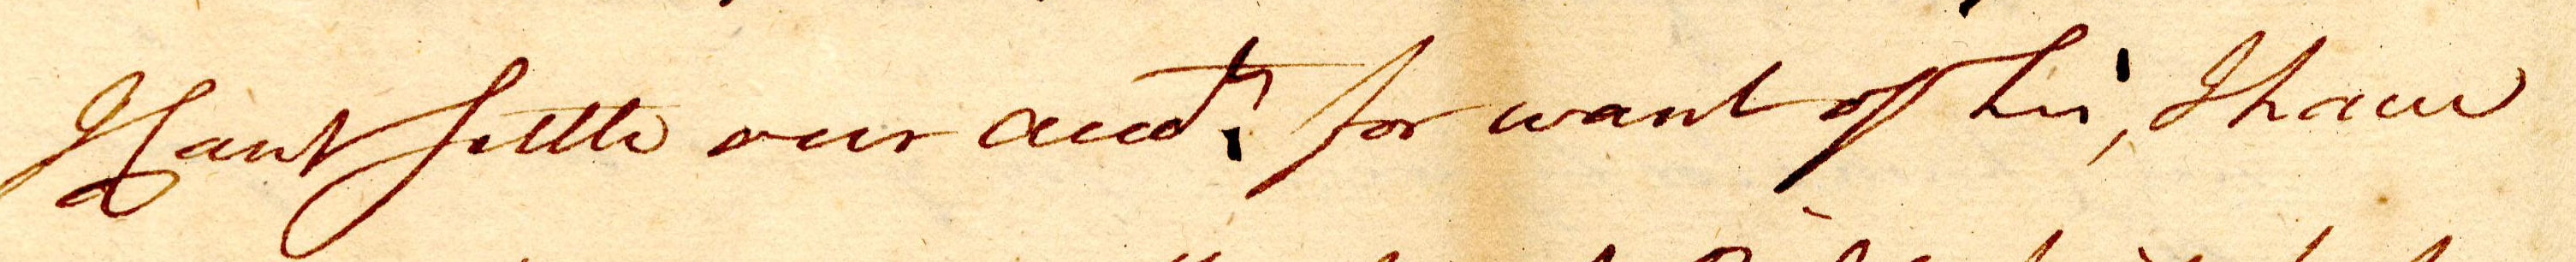hans settle our acco^t for want of his, I have
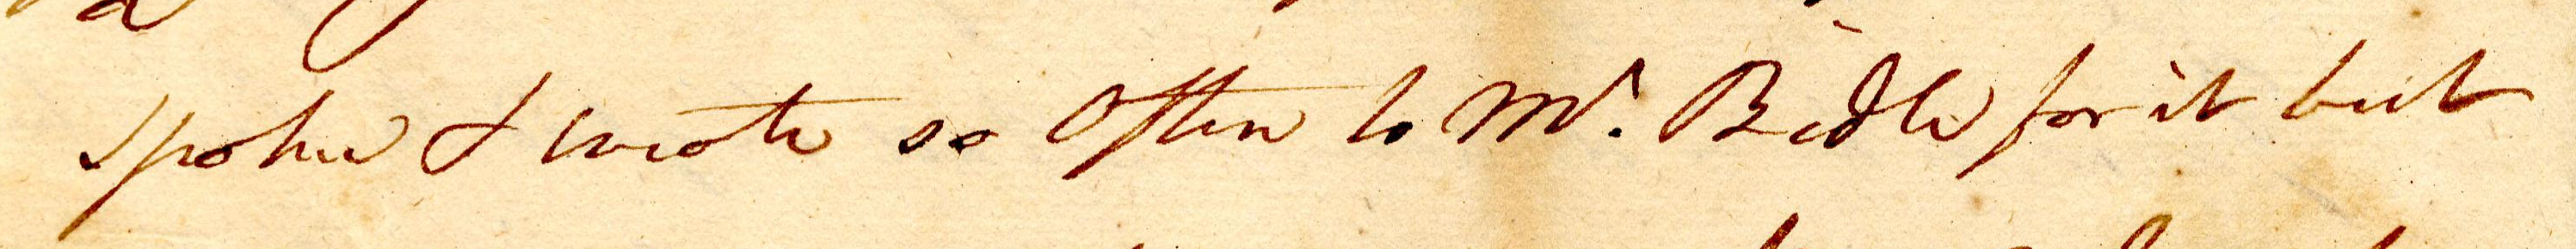spoke & wrote so Often to M^r. Bedle for it but
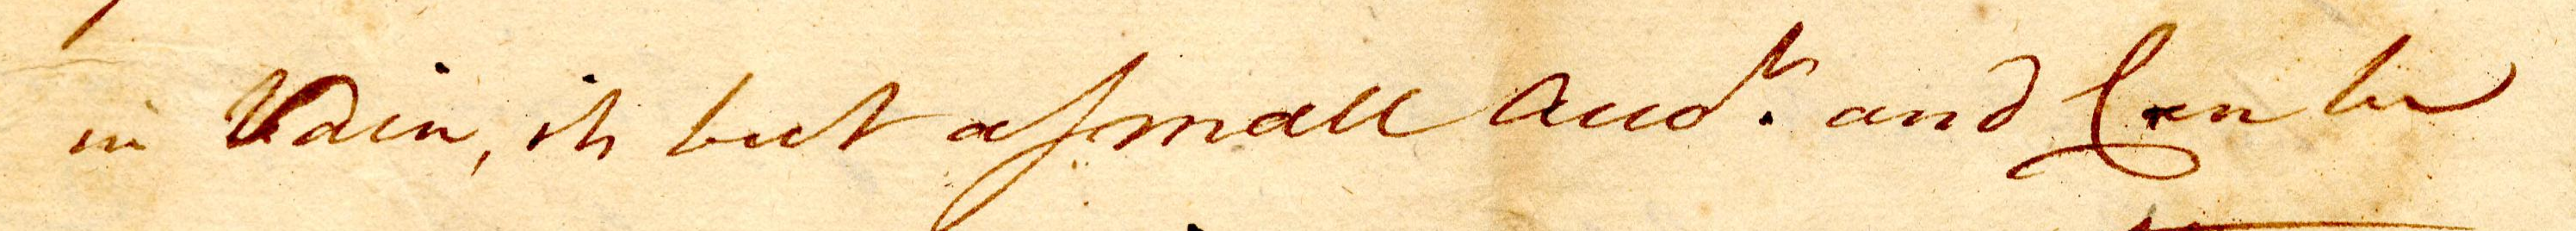in vain, its but as small Acco^t. and Can be
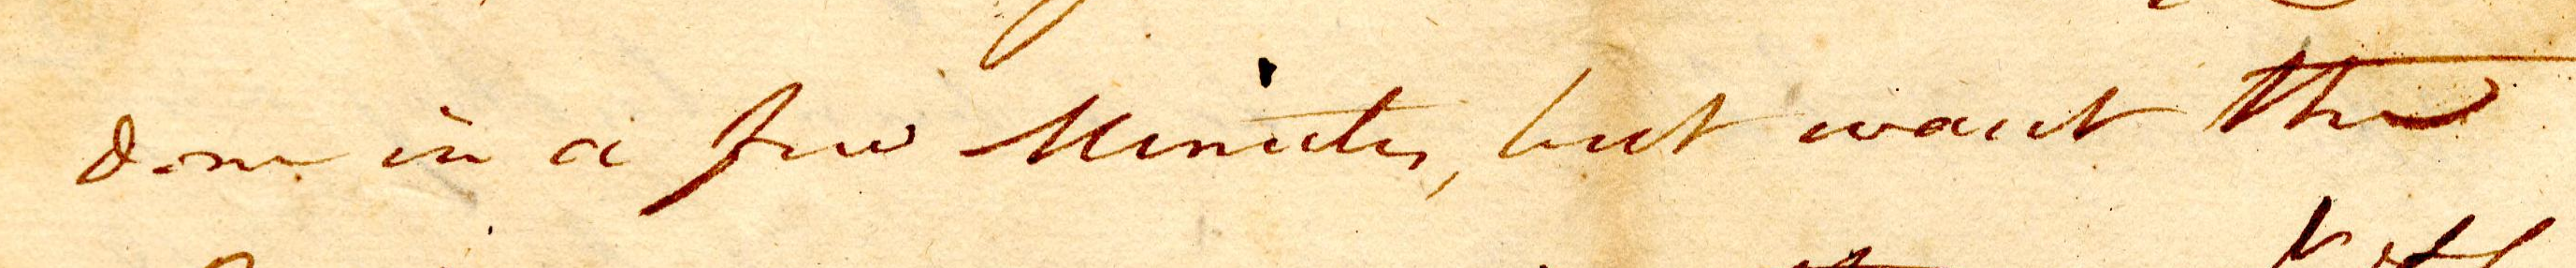dome in a few Minutes, but want the
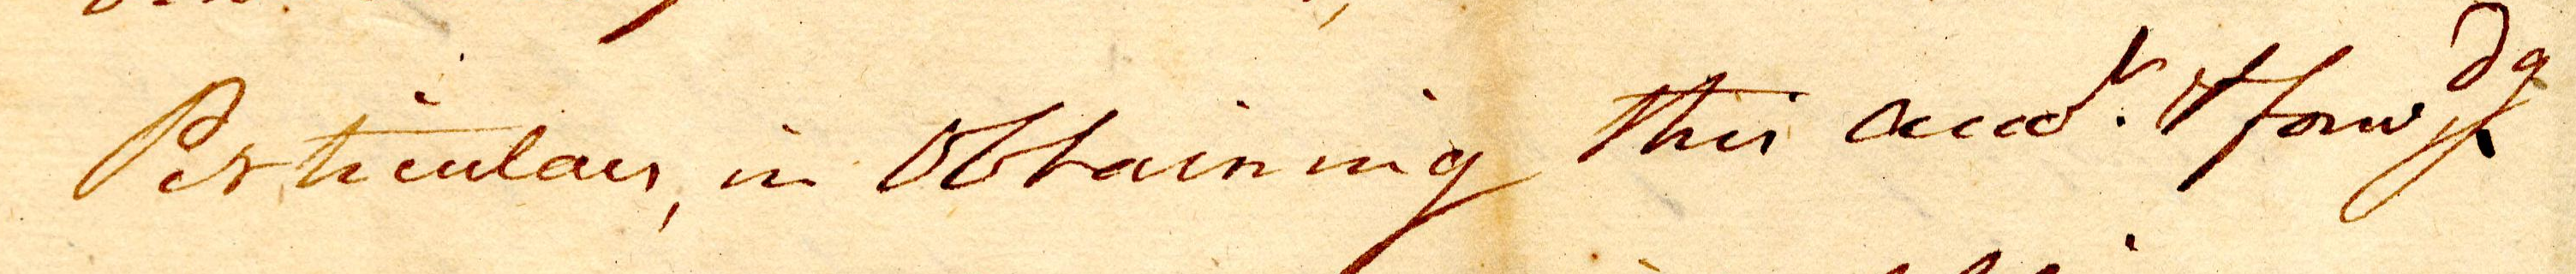Perticulars, in Obtaining this acco^t. & forw^dg
